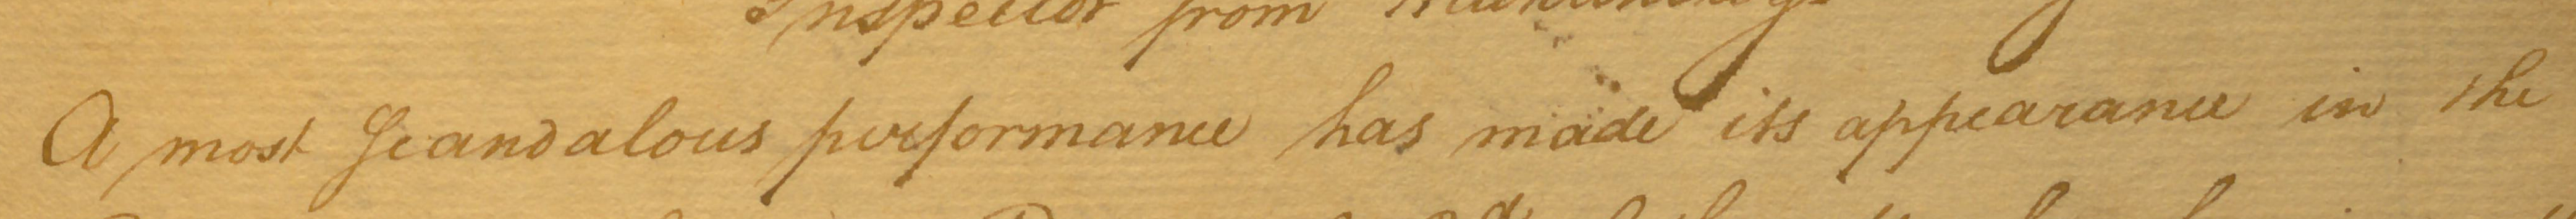A most scandalous performance has made its appearance in the
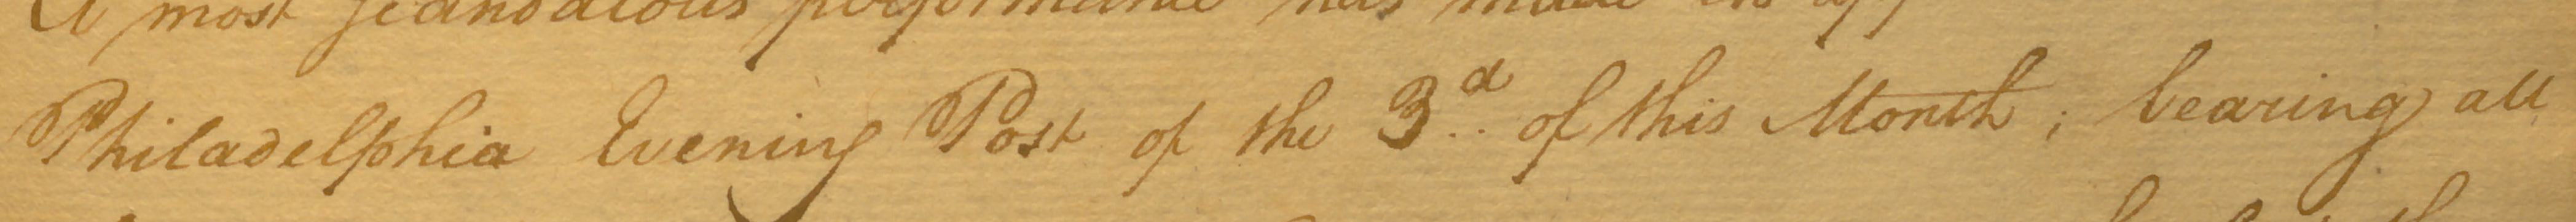Philadelphia Evening Post of the 3^d. of this Month; bearing all
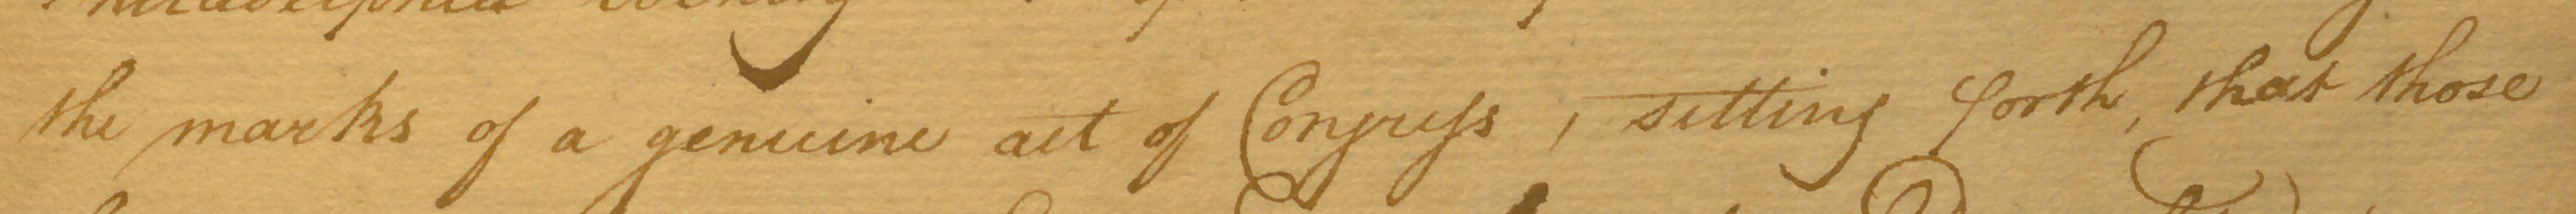the marks of a genuine act of Congress, setting forth, that those
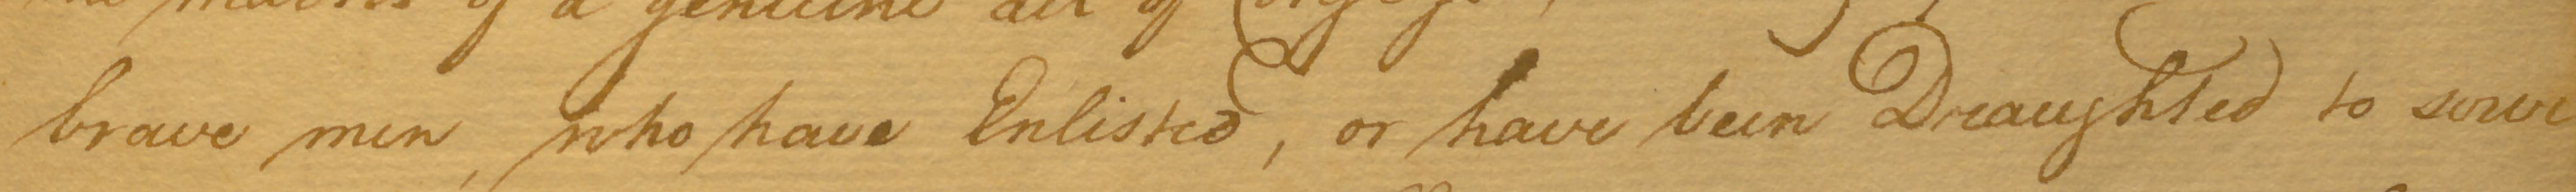brave men, who have Enlisted, or have been Draughted to serve
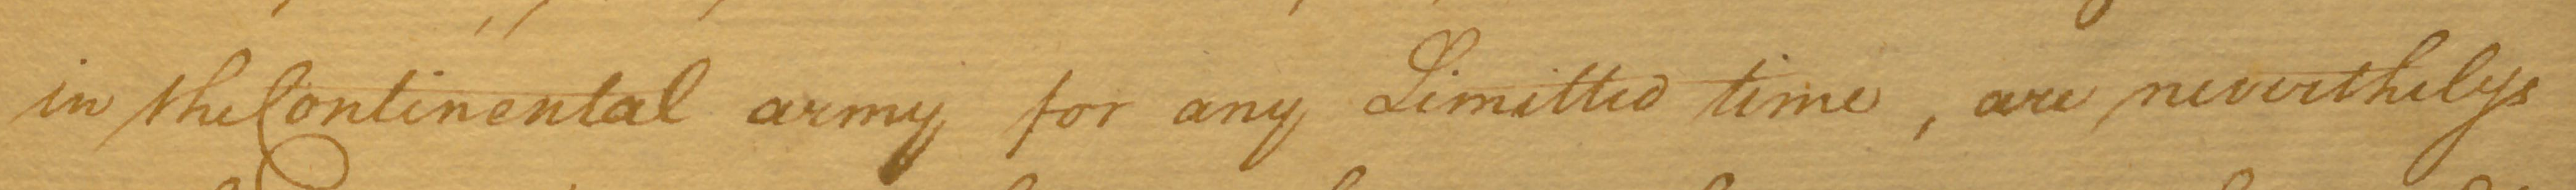in the Continental army for any Limitted time, are nevertheless
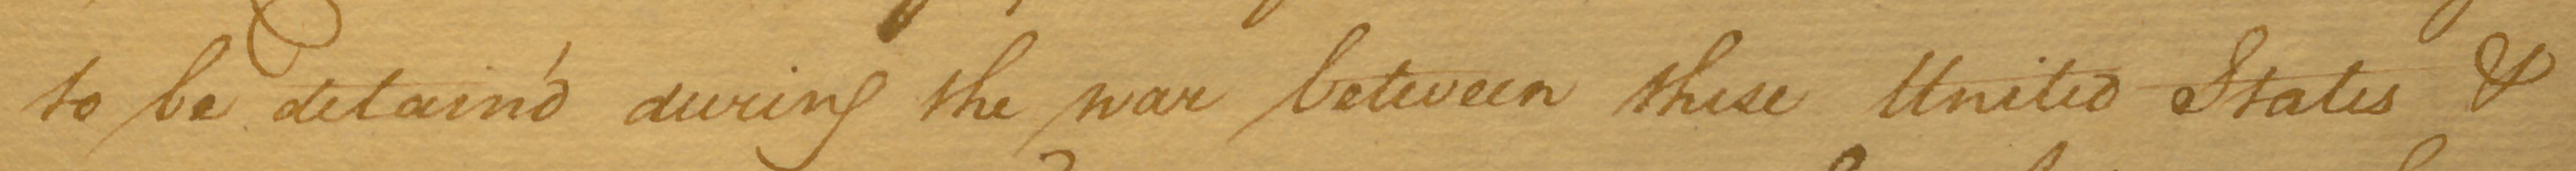to be detain'd during the war between these United States &
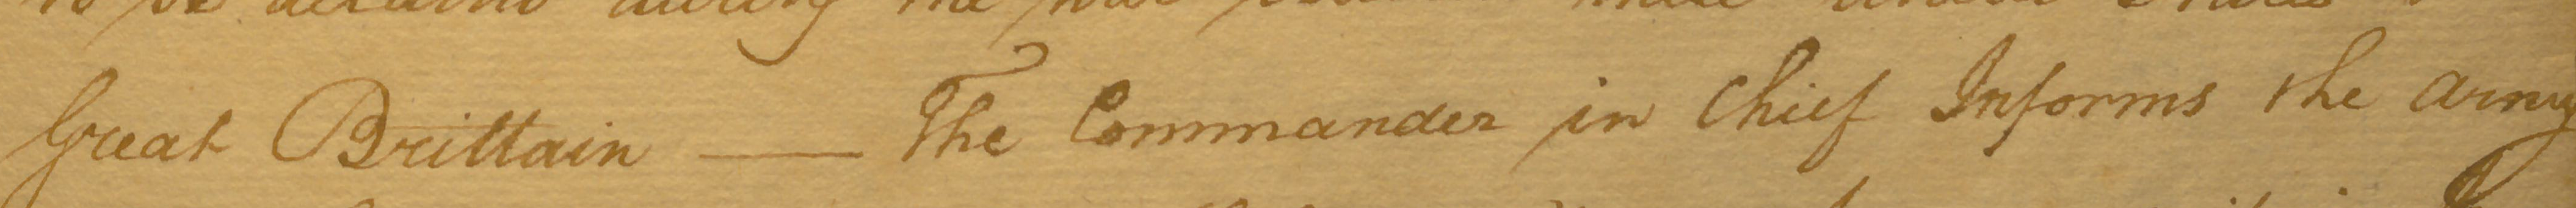Great Britain- The Commander in Chief Informs the Army
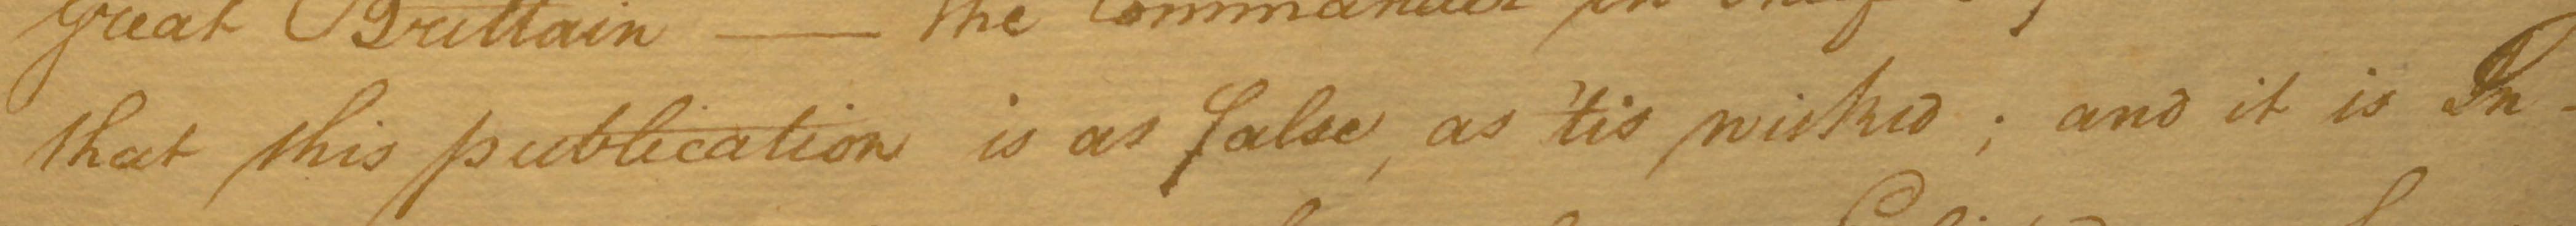that this publication is as false, as 'tis wicked; and it is In
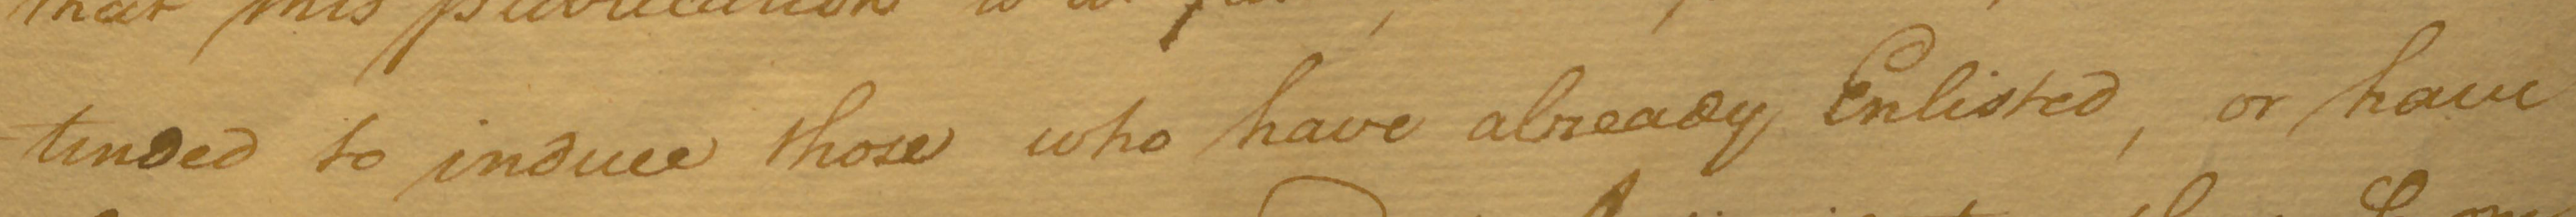-tended to induce those who have already Enlisted, or have
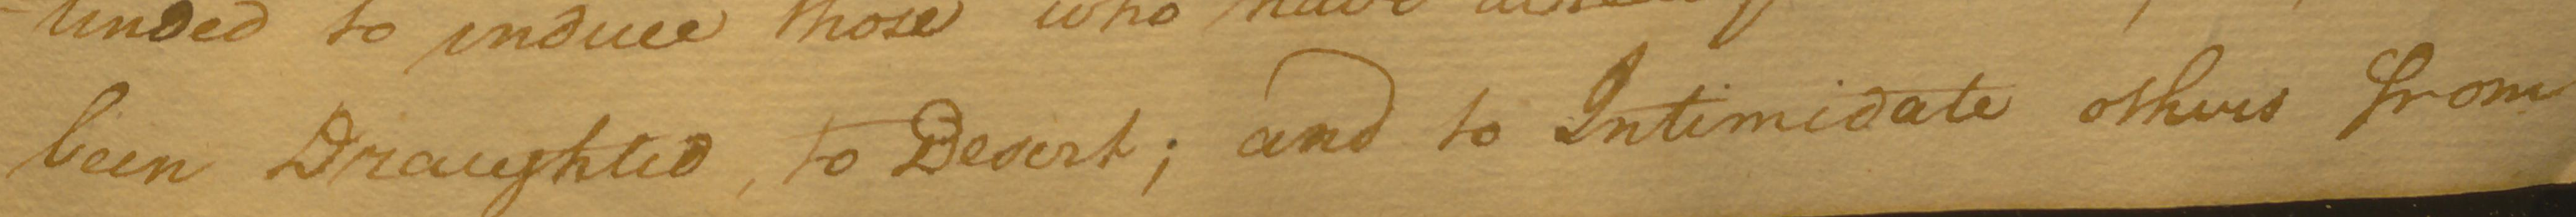been Draughted, to Desert; and to Intimidate others from
